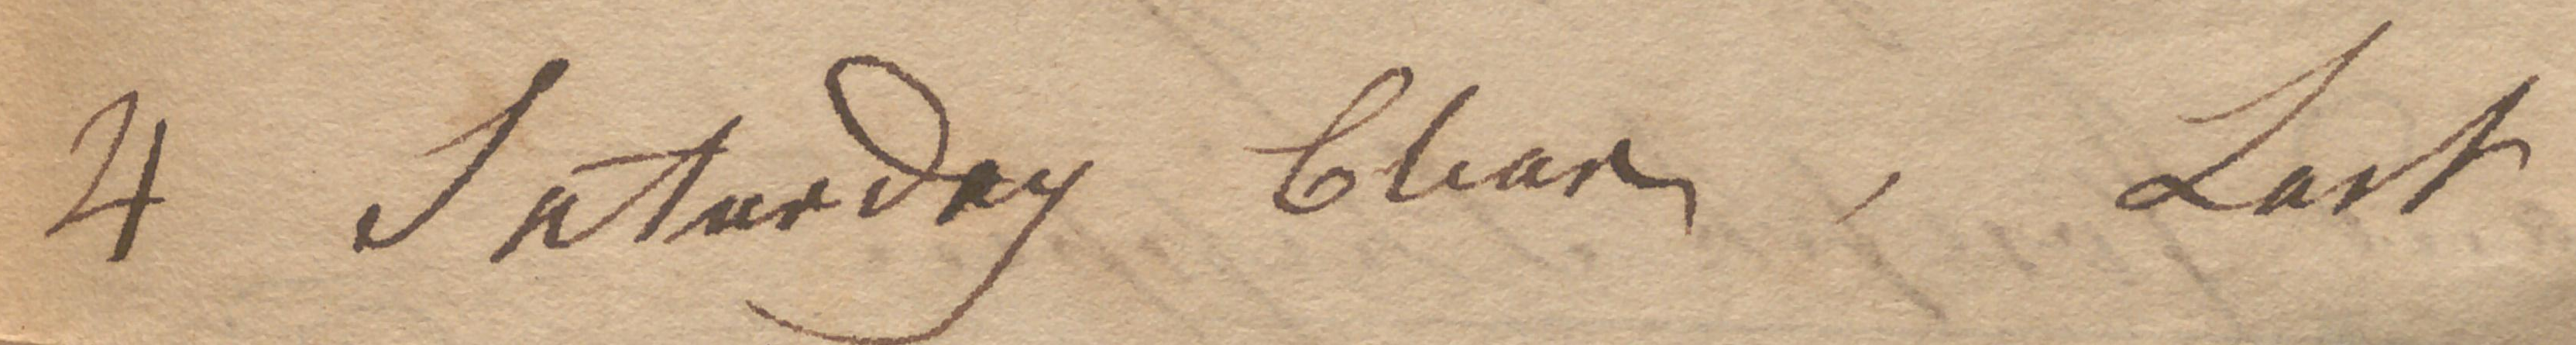4 Saturday Clear, Last
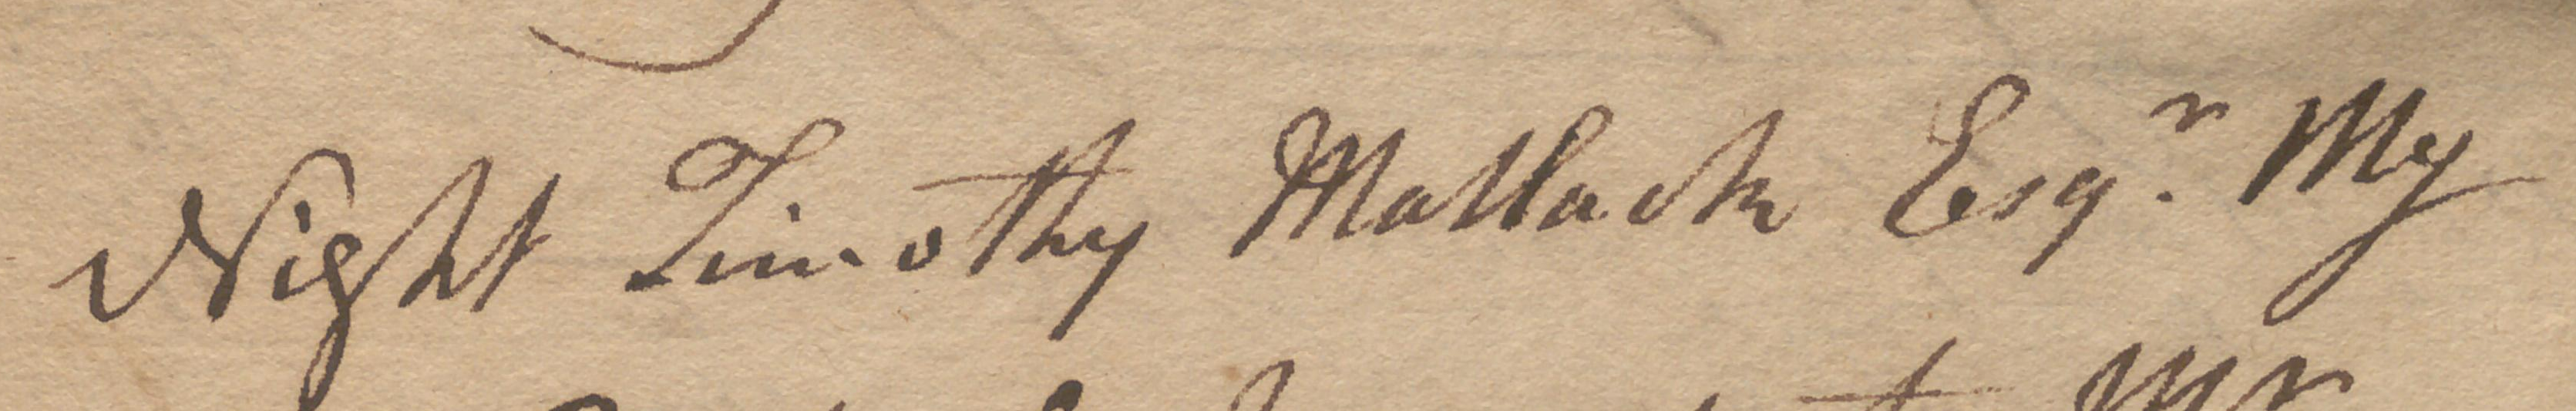Night Timothy Mallack Esq^r. My
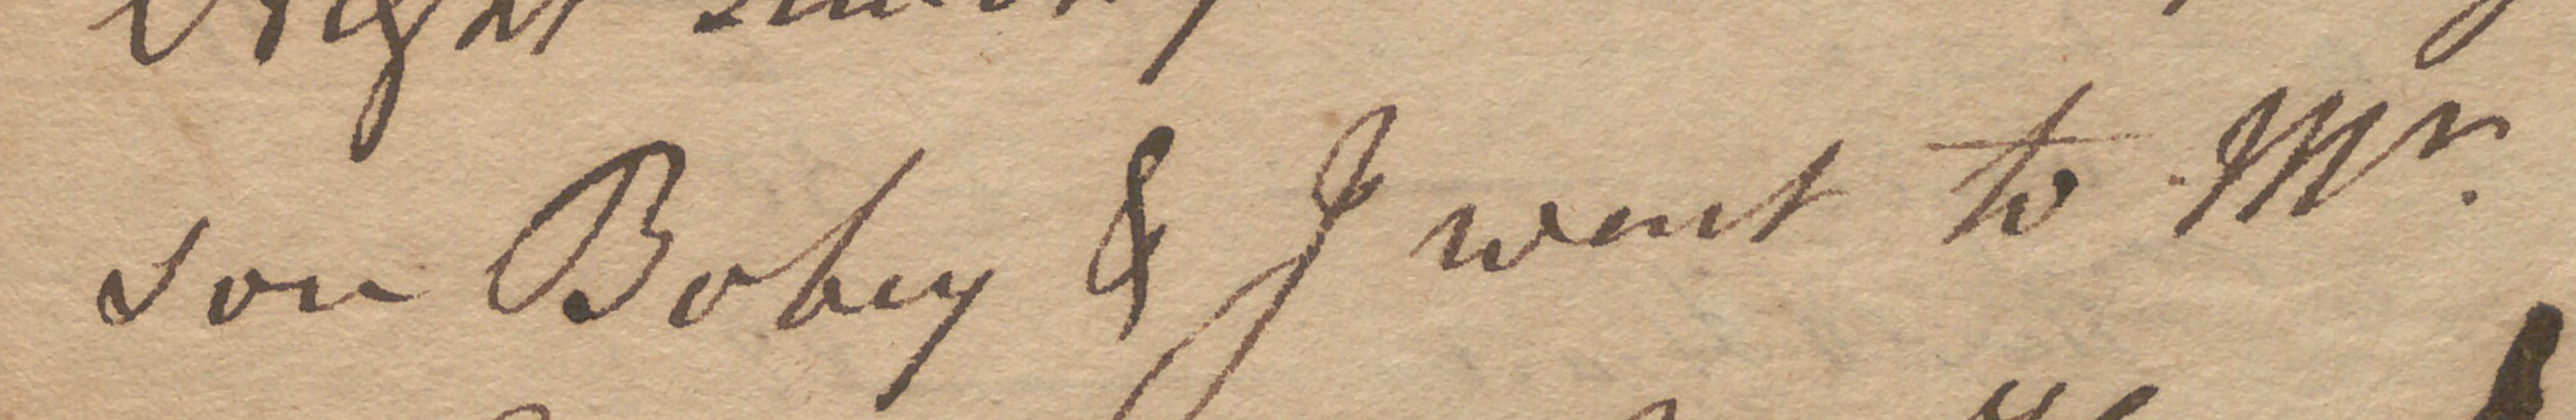sou Bobey & I went to M^r.
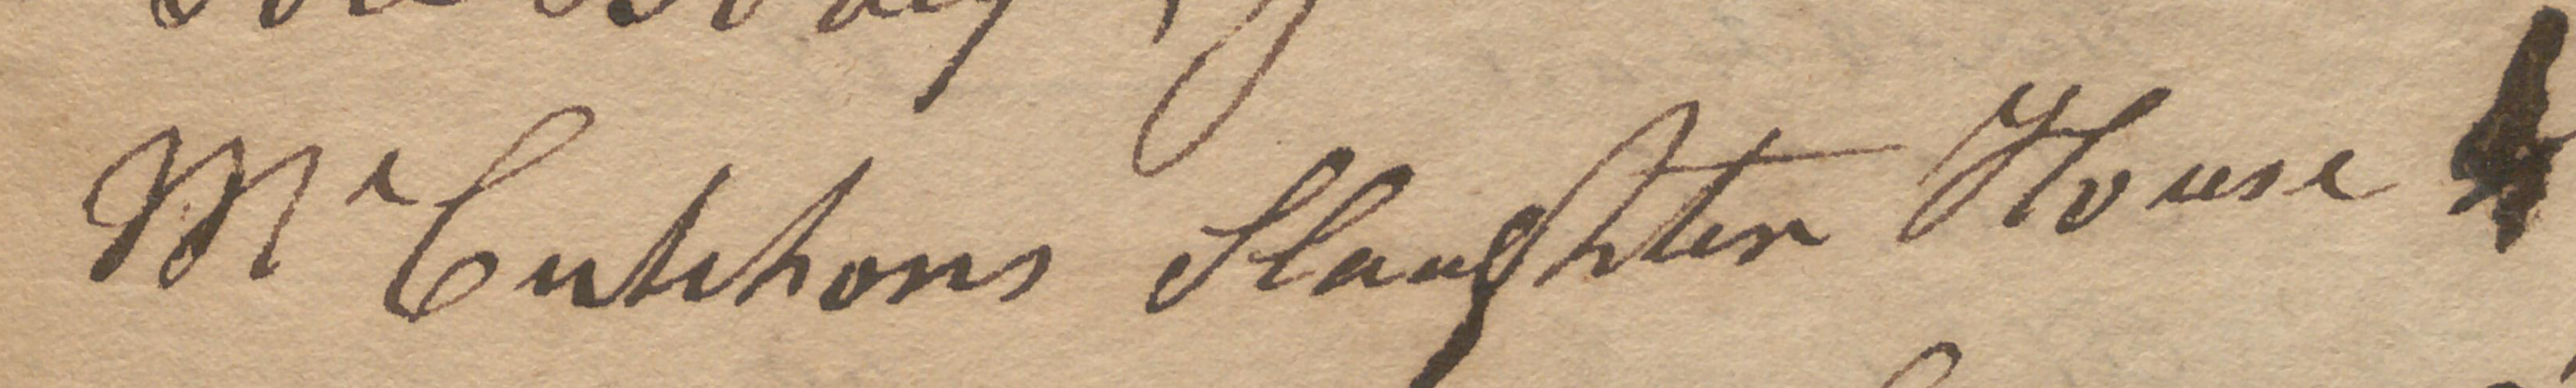M^cCutchons Slaughter House
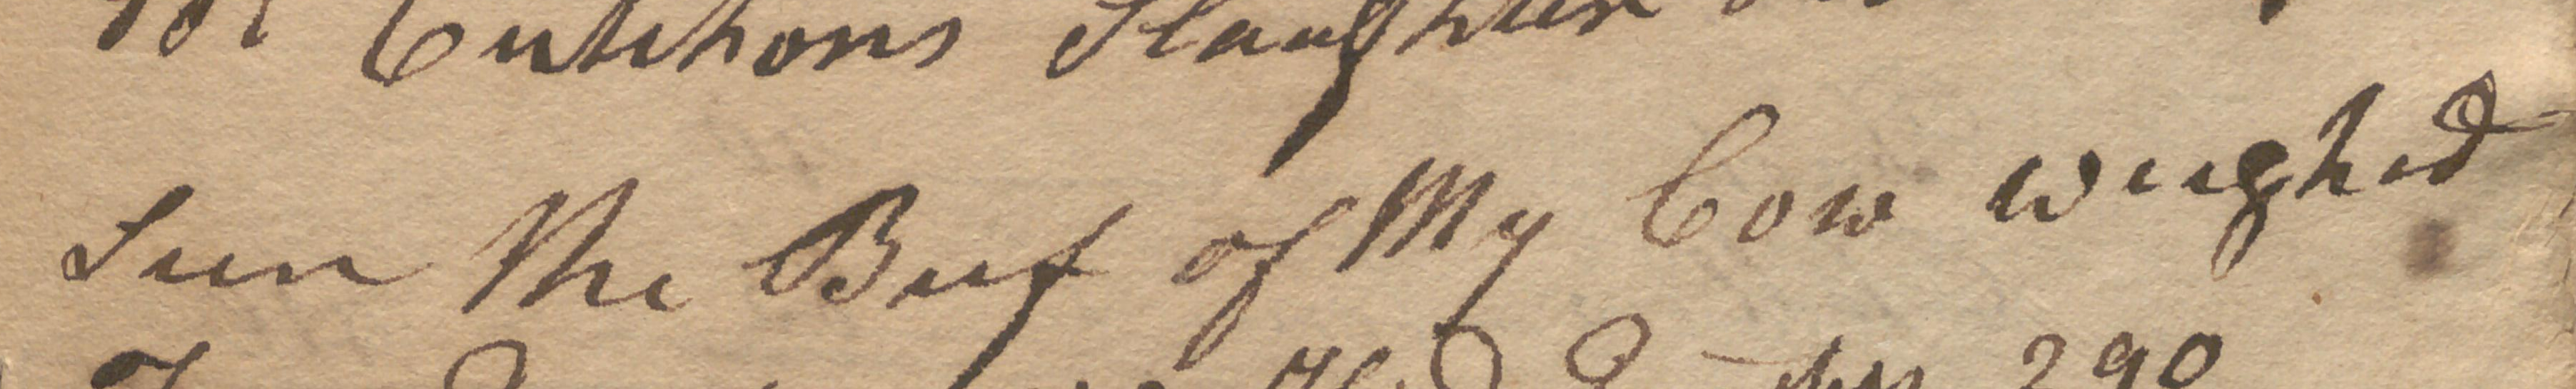sun the Beef of My Cow weighed
